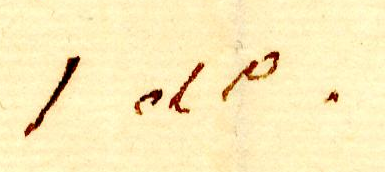1 d^o.
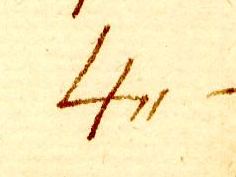4..
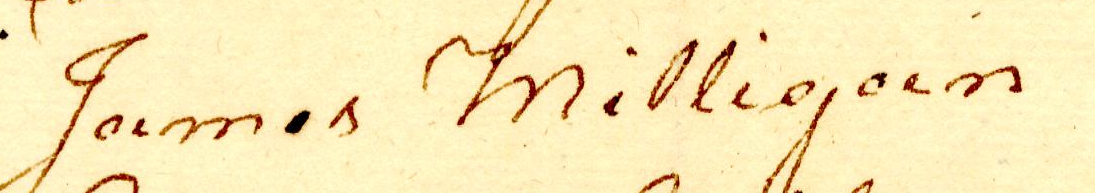James Milligan
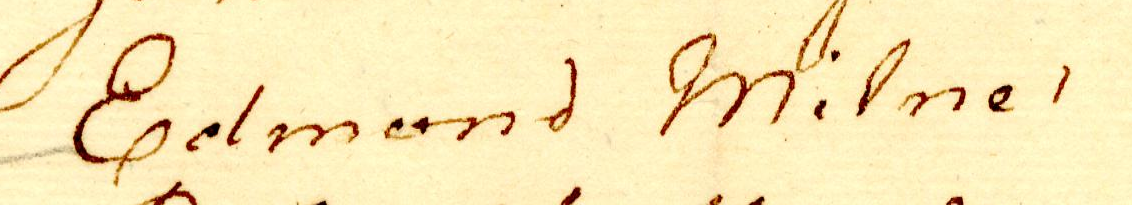Edmond Milne
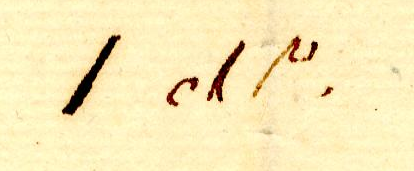1 d^o.
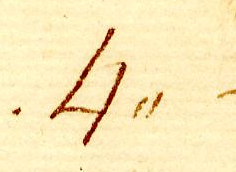4..
